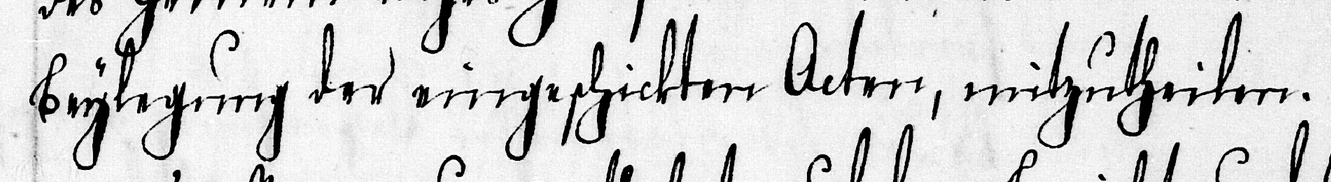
Beylegung der eingeschickten Acten, mitzutheilen.
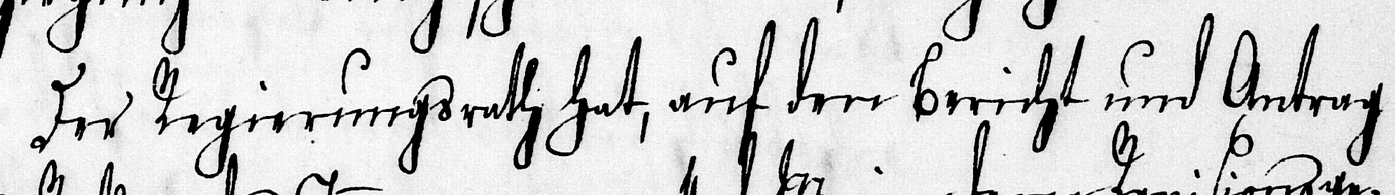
Der Regierungsrath hat, auf den Bericht und Antrag
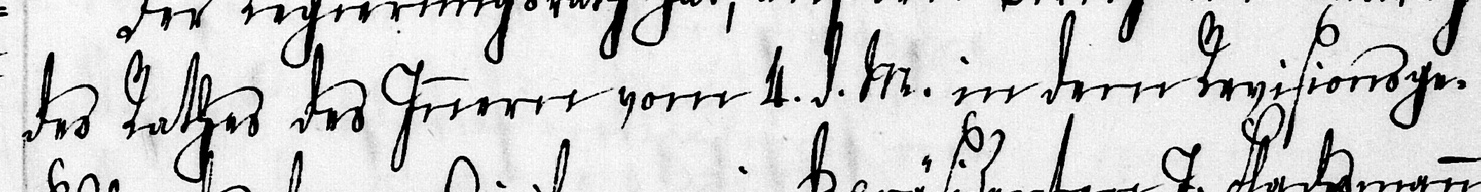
des Rathes des Innern vom 4. d. M. in dem Revisionsge¬
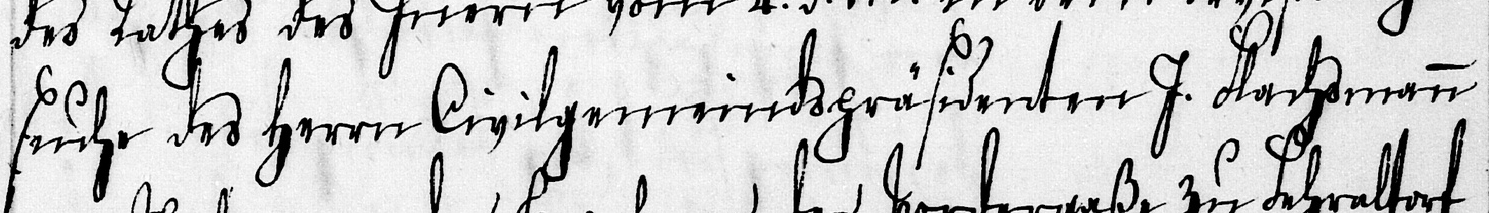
suche des Herrn Civilgmeindspräsidenten J. Flachsmann
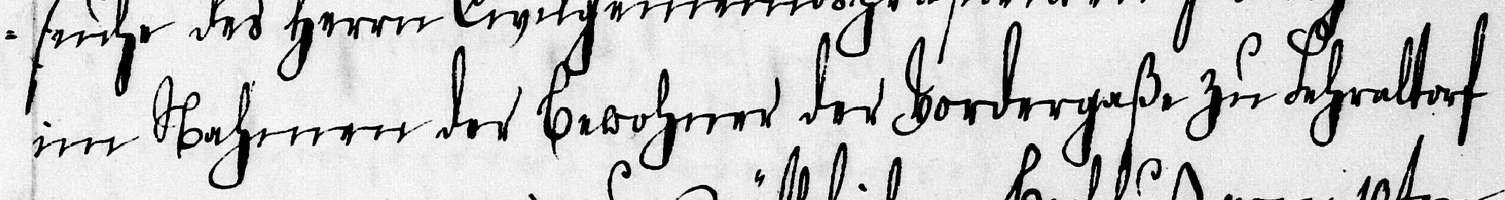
im Nahmen der Bewohner der Vordergaße zu Fehraltorf
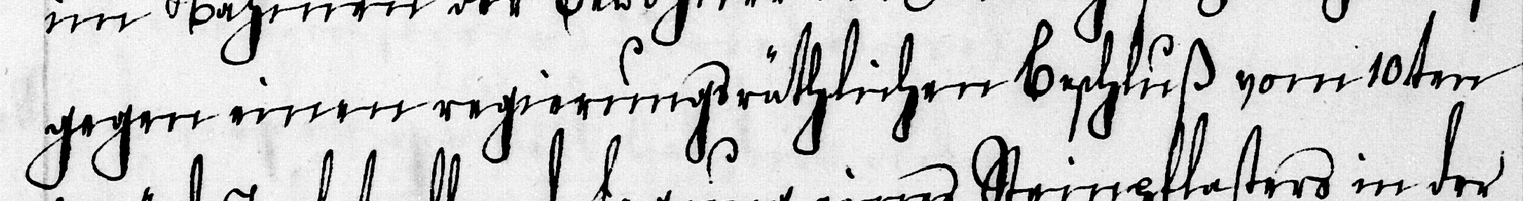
gegen einen regierungsräthlichen Beschluß vom 10ten
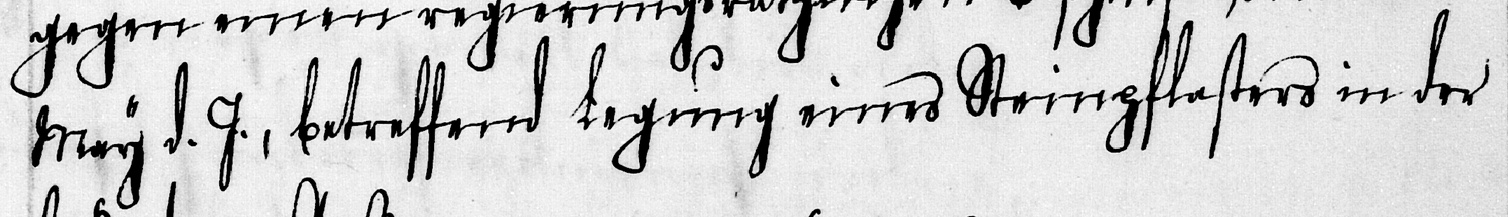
May d. J., betreffend Legung eines Steinpflasters in der
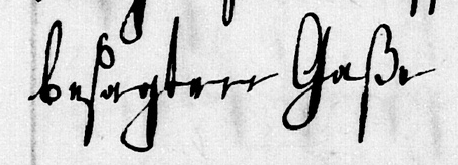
besagten Gaße
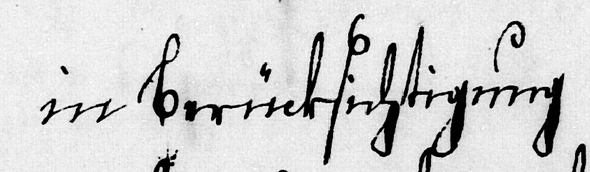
in Berücksichtigung
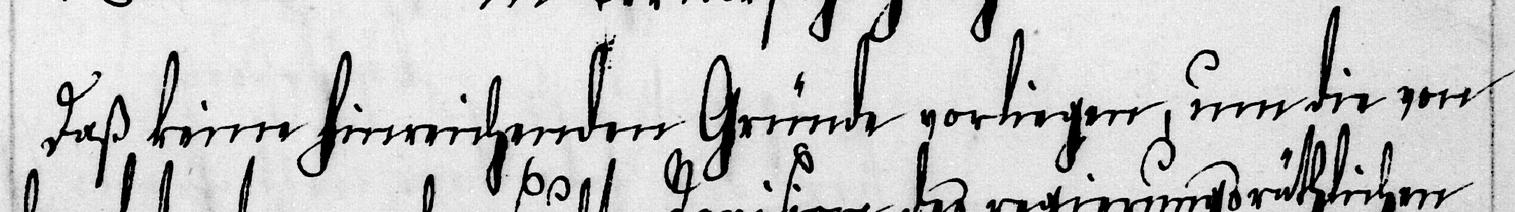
Daß keine hinreichenden Gründe vorliegen, um die von
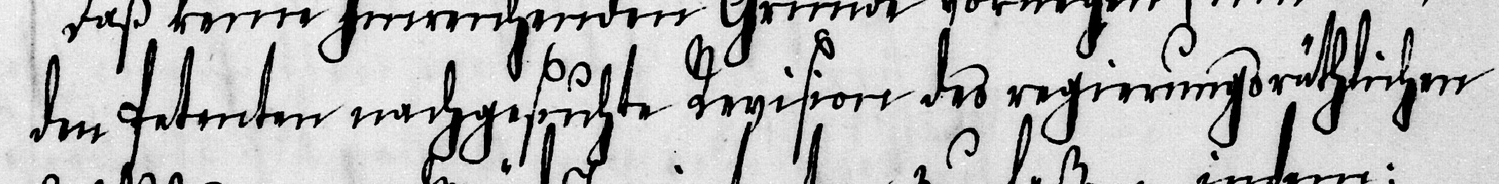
den Petenten nachgesuchte Revision des regierungsräthlichen
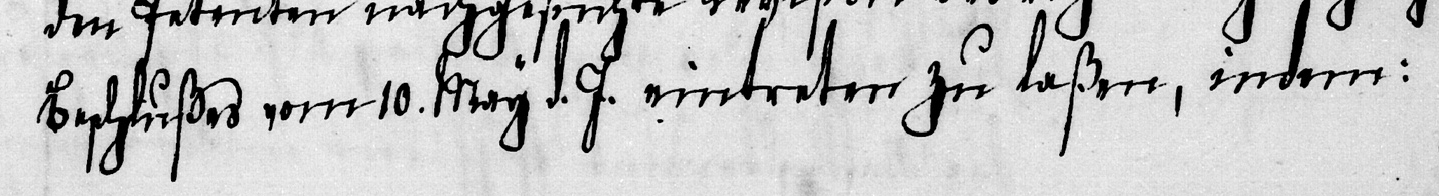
Beschlußes vom 10. May d. J. eintreten zu laßen, indem:
